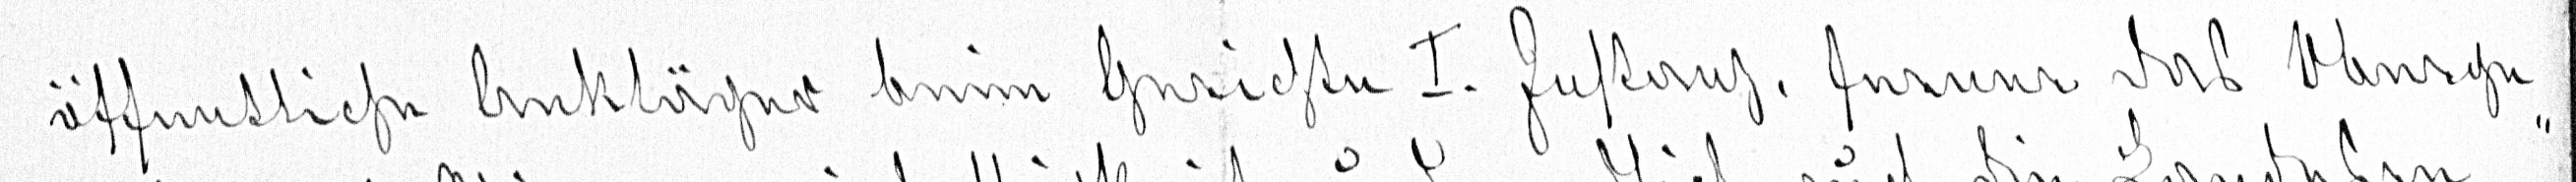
öffentliche Ankläger beim Gerichte I. Instanz, ferner das Oberge¬
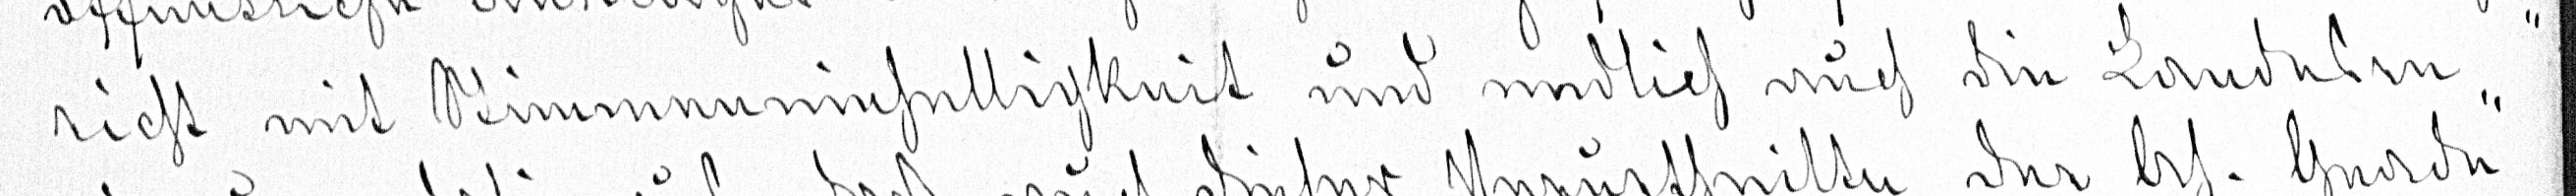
richt mit Stimmeneinhelligkeit und endlich auch die Landesre¬
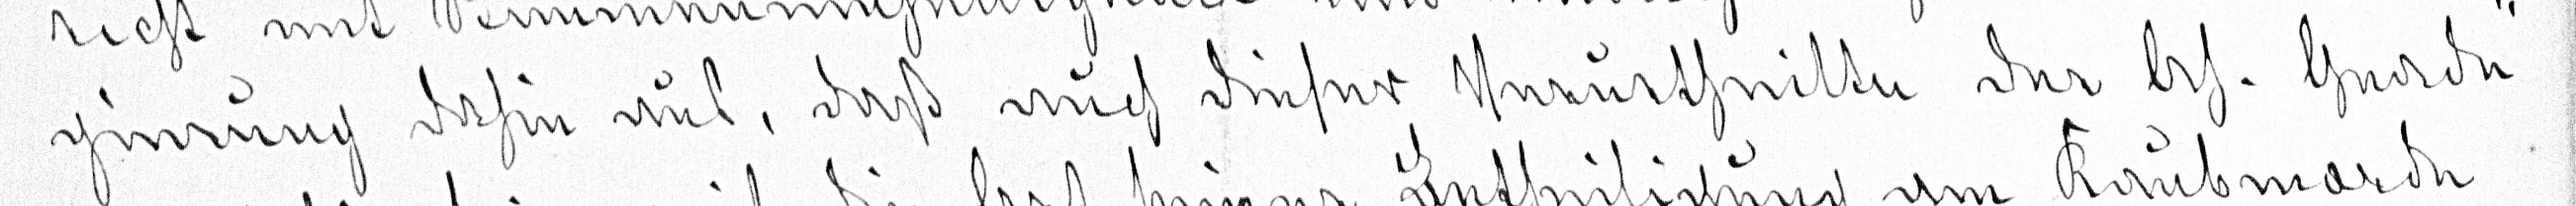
gierung dahin aus, daß auch dieser Verurtheilte der Az. Gnade
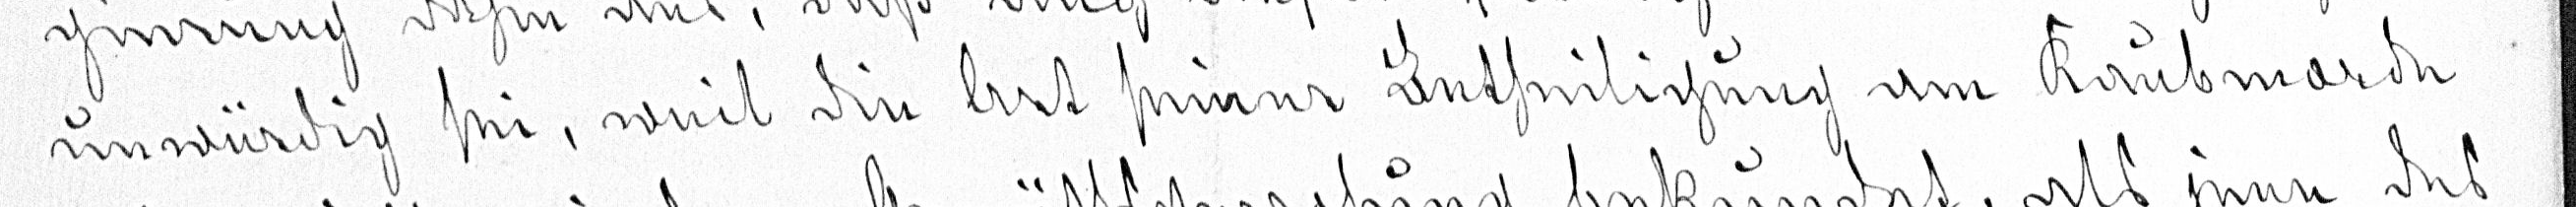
unwürdig sei, weil die Art seiner Betheiligung am Raubmorde
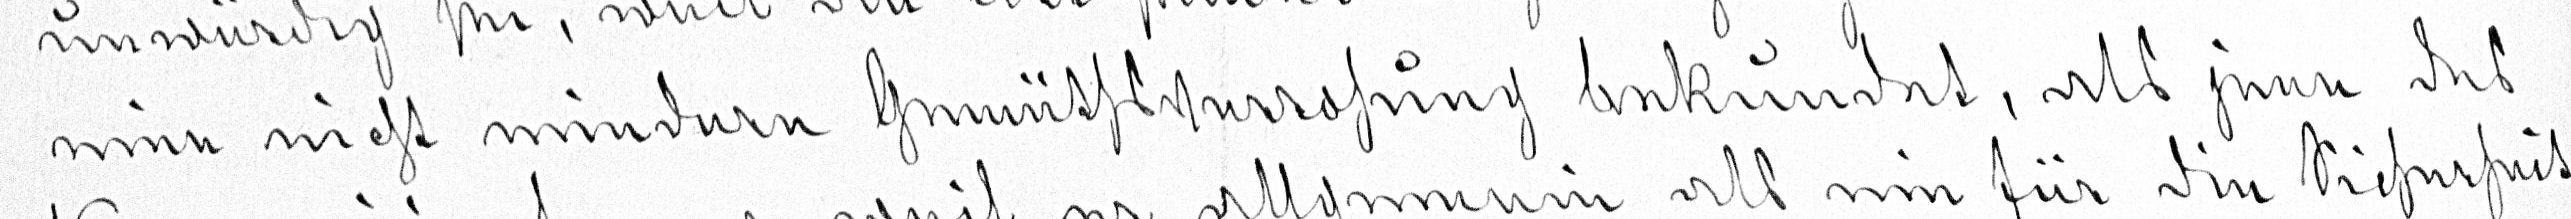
eine nicht mindere Gemüthsverrohung bekundet, als jene des
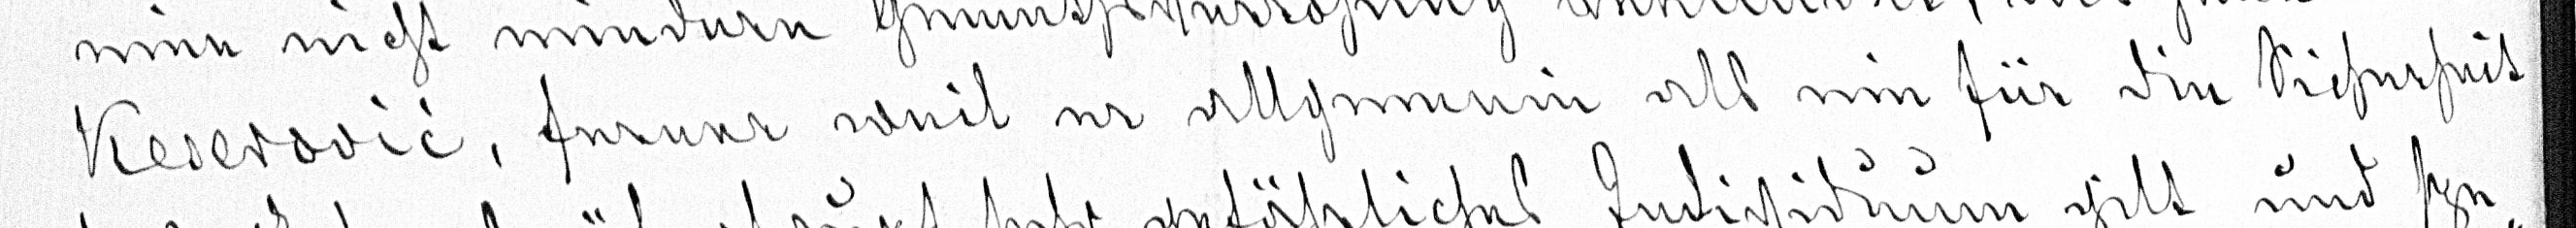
Keserović, ferner weil er allgemein als ein für die Sicherheit
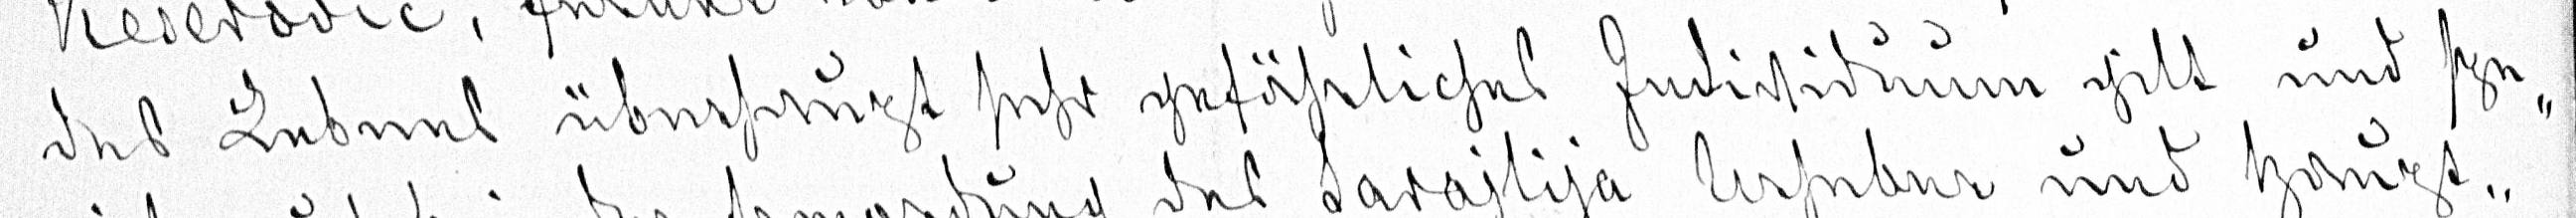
des Lebens überhaupt sehr gefährliches Individuum gilt und spe¬
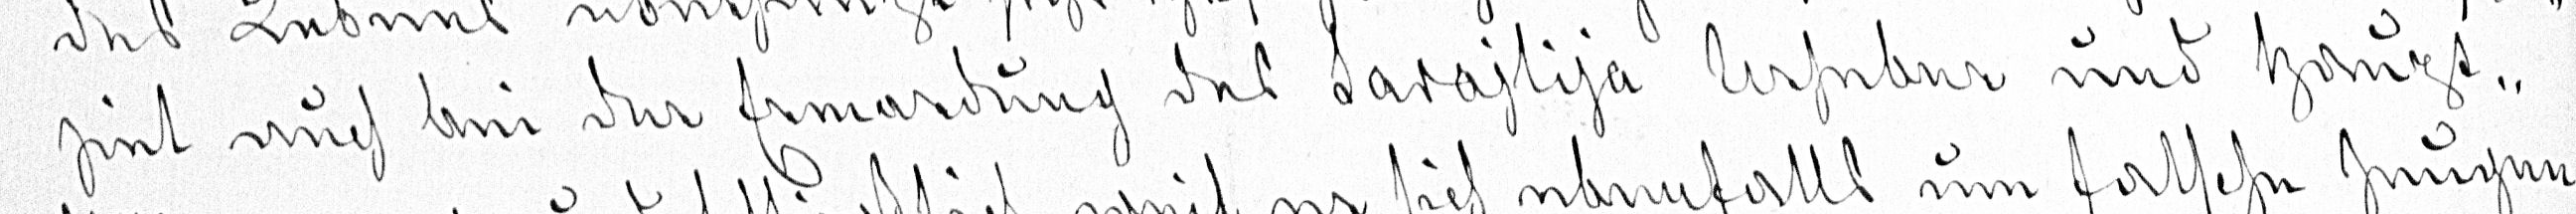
ziel auch bin der Ermordung des Sarajlija Urheber und Haupt¬
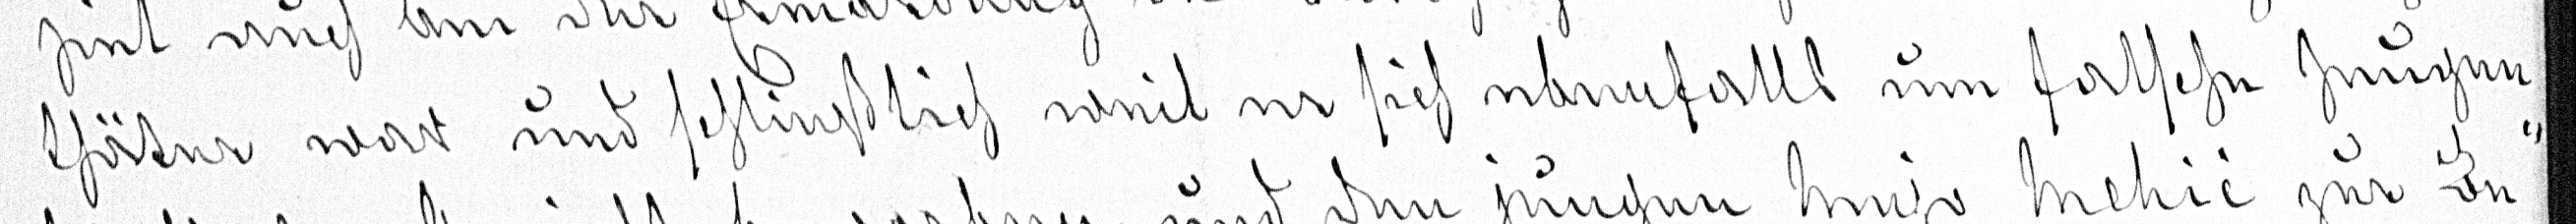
thäter war und schließlich weil er sich ebenfalls um falsche Zeugen¬
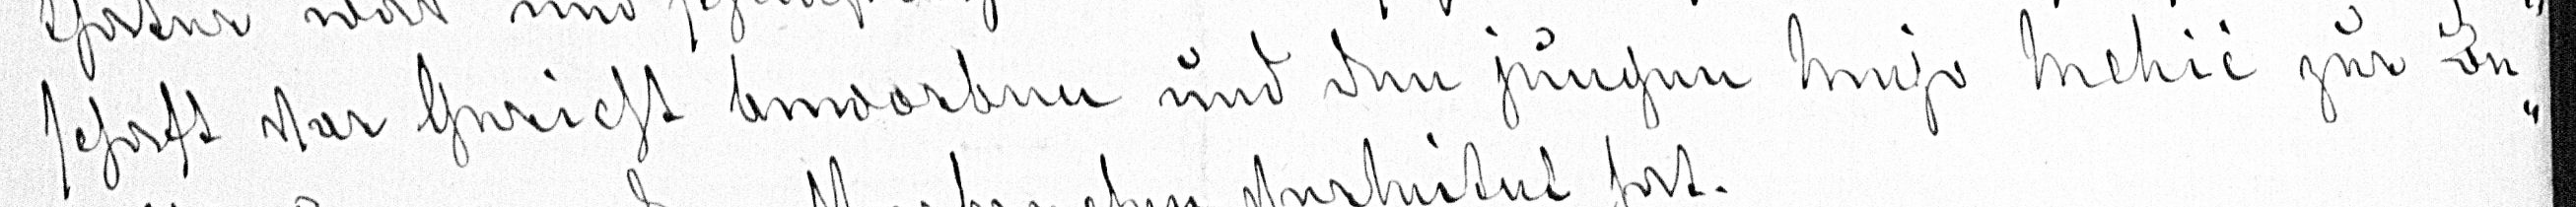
schaft vor Gericht beworben und den jungen Mujo Mehić zur Be¬
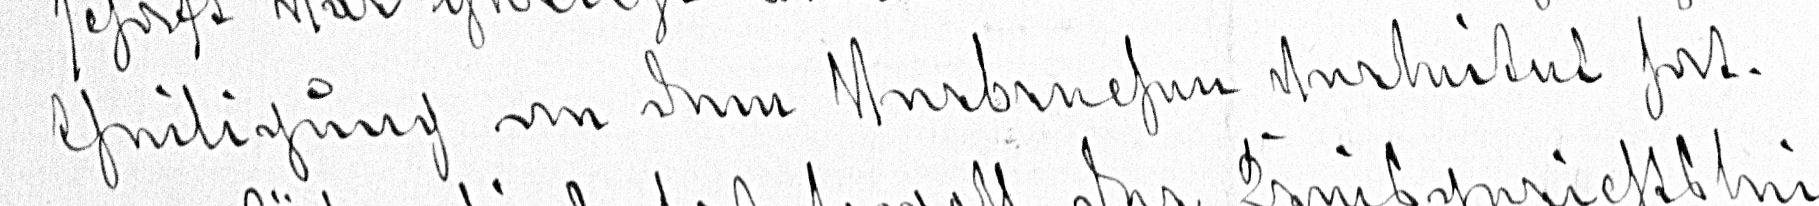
theiligung an dem Verbrechen verleitet hat.
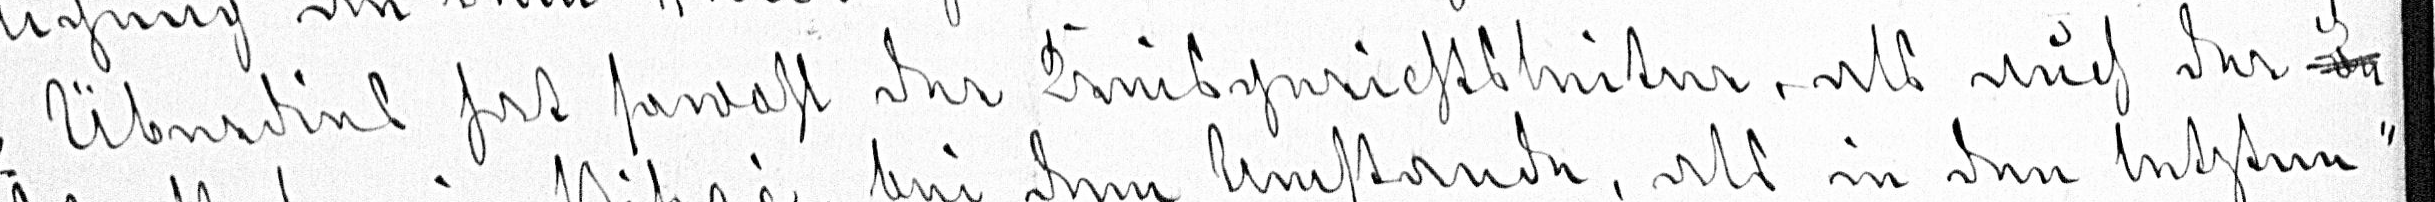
Überdies hat sowohl der Kreisgerichtsleiter, als auch der
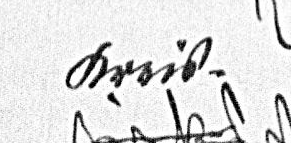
Kreis
